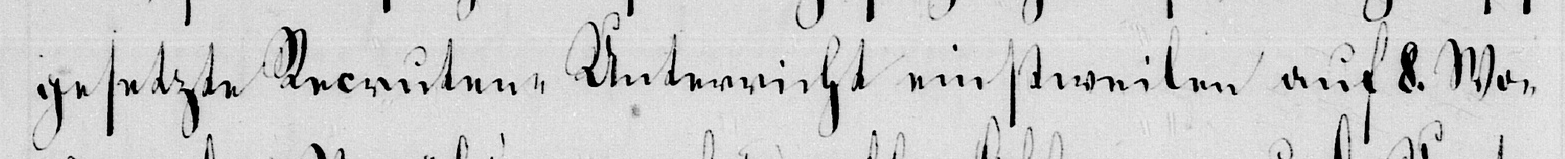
gesetzte Recruten-Unterricht einstweilen auf 8. Wo¬
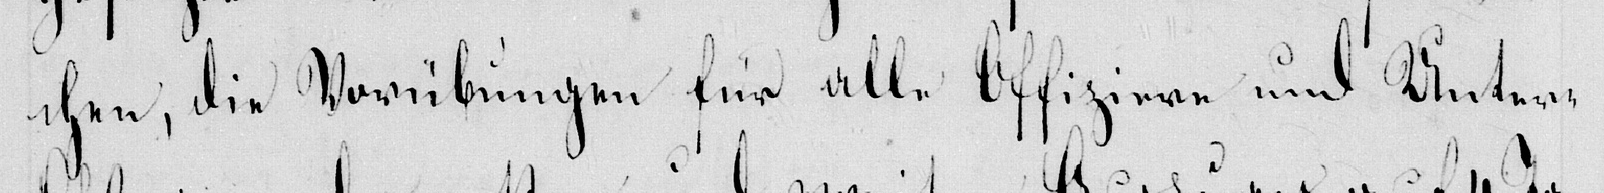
chen, die Vorübungen für alle Offiziere und Unte¬
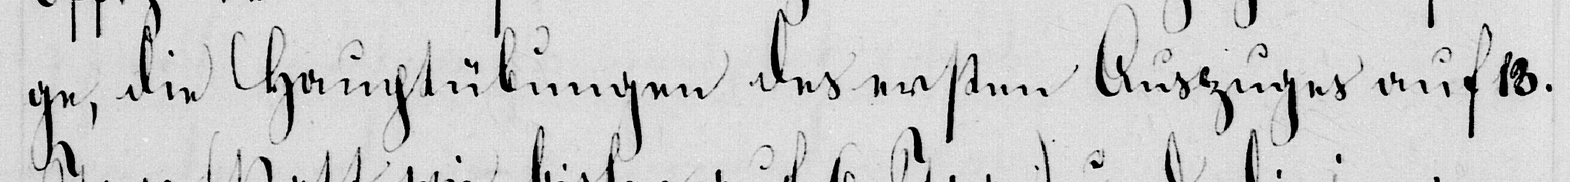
ge, die Hauptübung des ersten Auszuges auf 13.
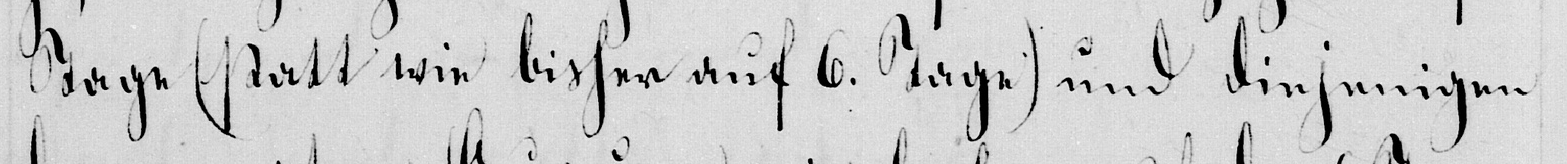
Tage (statt wie bisher auf 6. Tage) und diejenigen
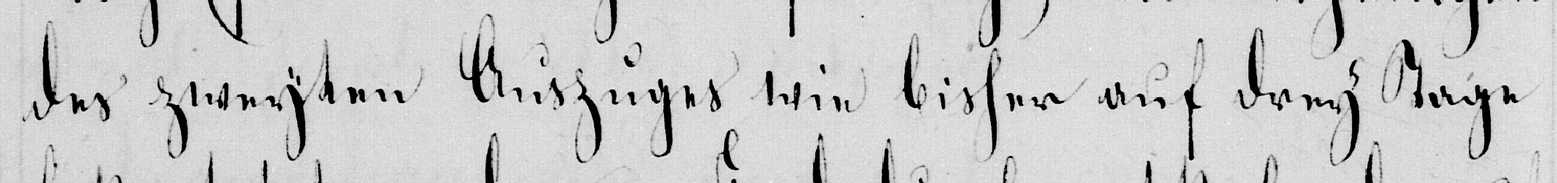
des zweiten Auszuges wie bisher auf drey Tage
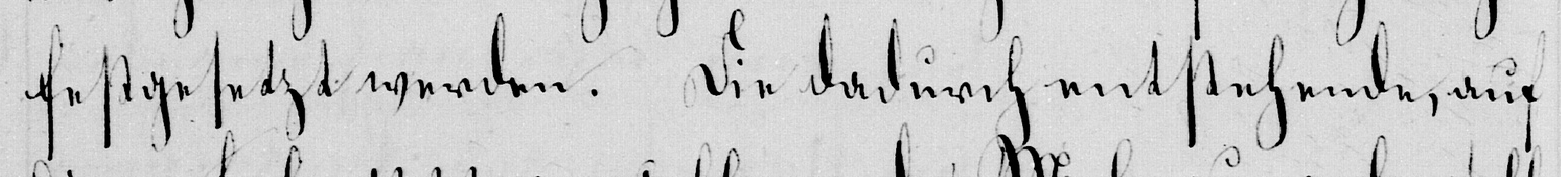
festgesetzt werden. Die dadurch entstehende, auf
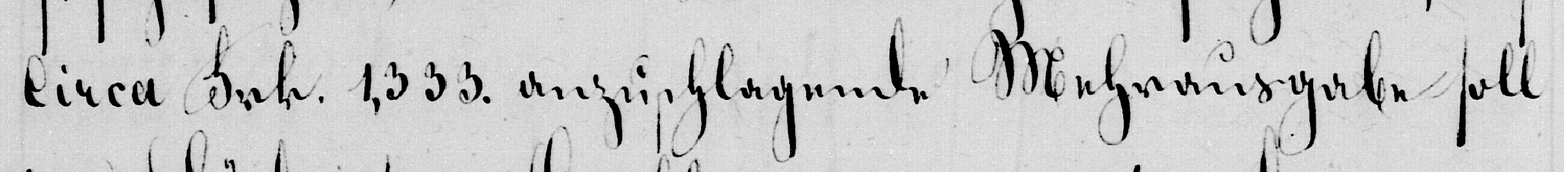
circa Frk. 1,333. anzuschlagende Mehrausgabe soll
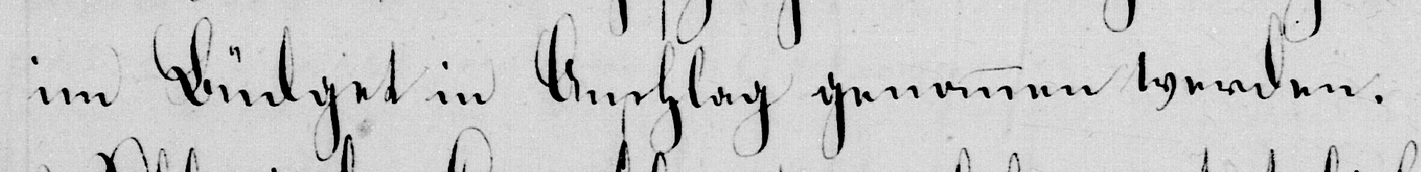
im Büdget in Anschlag genommen werden.
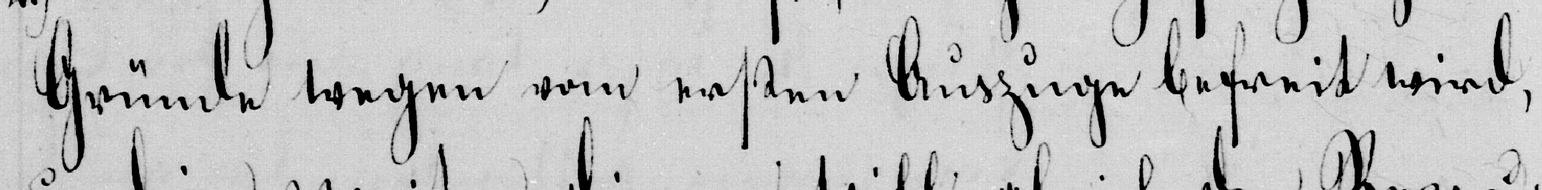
Gründe wegen vom ersten Auszuge befreit wird,
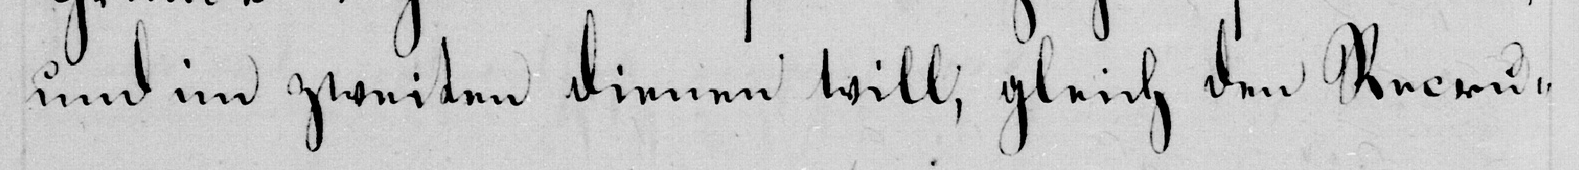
und im zweiten dienen will, gleich den Recru-
